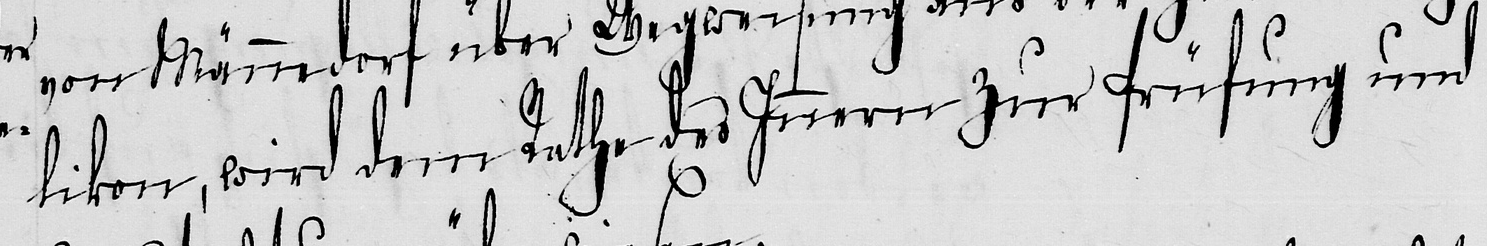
likon, wird dem Rathe des Innern zur Prüfung und
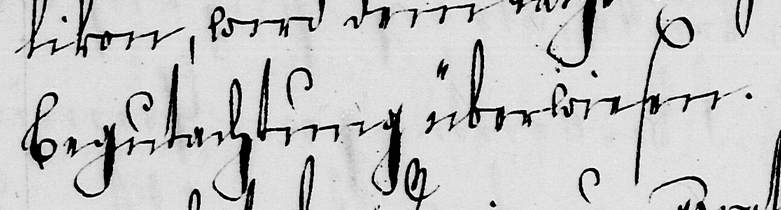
Begutachtung überwiesen.
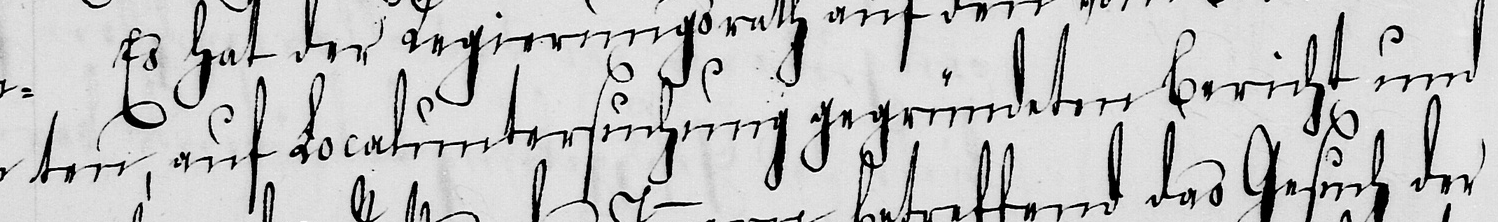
ten, auf Localuntersuchung gegründeten Bericht und
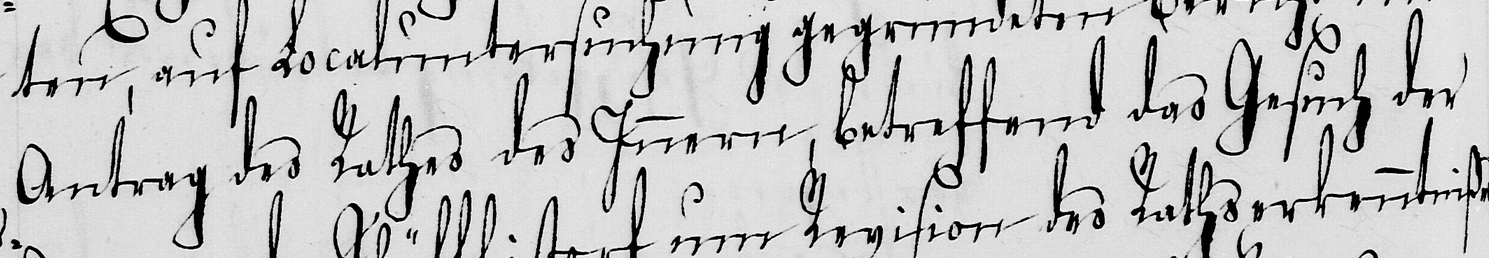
Antrag des Rathes des Innern, betreffend das Gesuch der
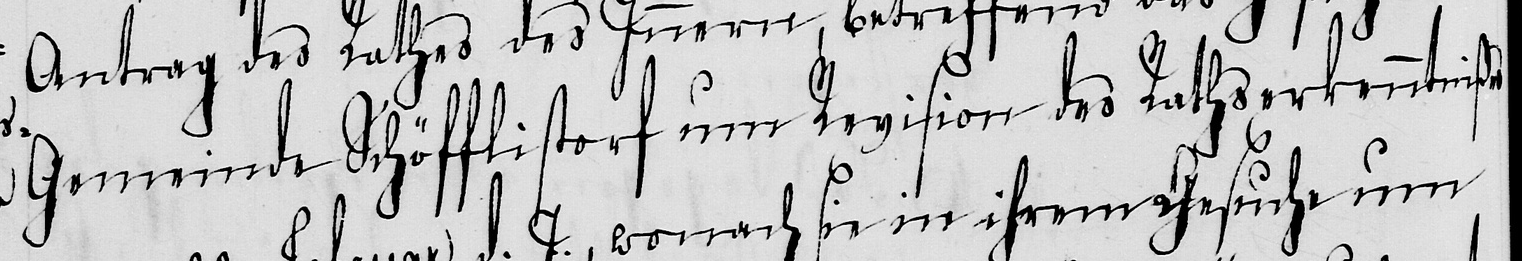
Gemeinde Schöfflistorf um Revision des Rathserkenntni¬
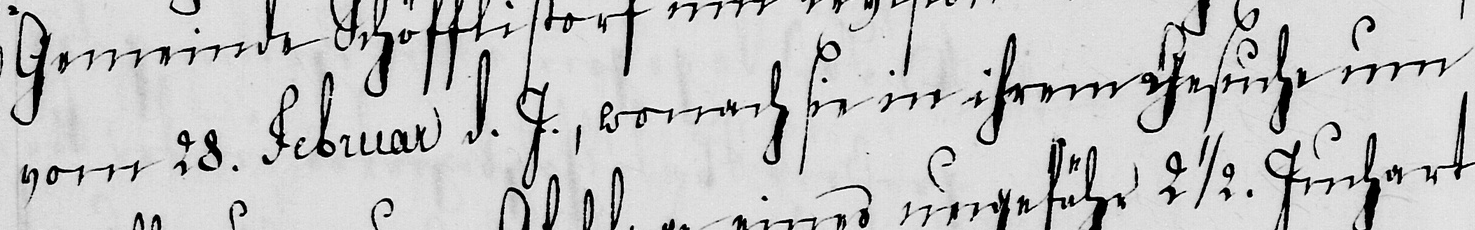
vom 28. Februar d. J., wonach sie in ihrem Gesuche um
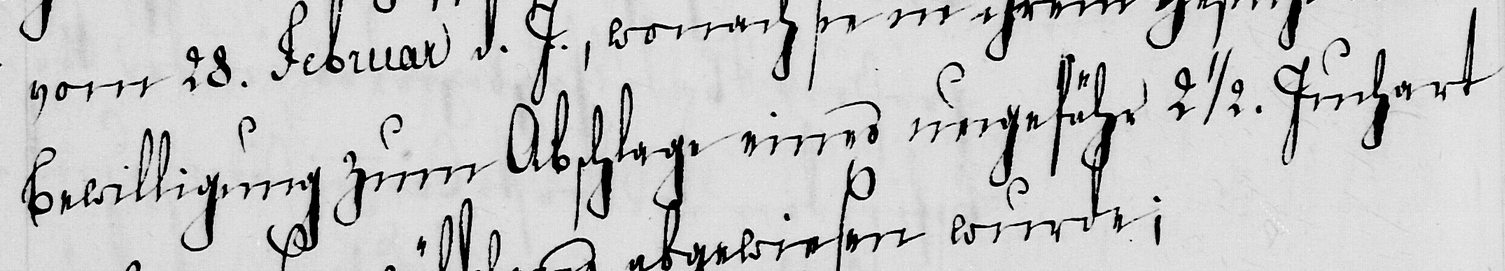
Bewilligung zum Abschlage eines ungefähr 2 1/2. Juchart
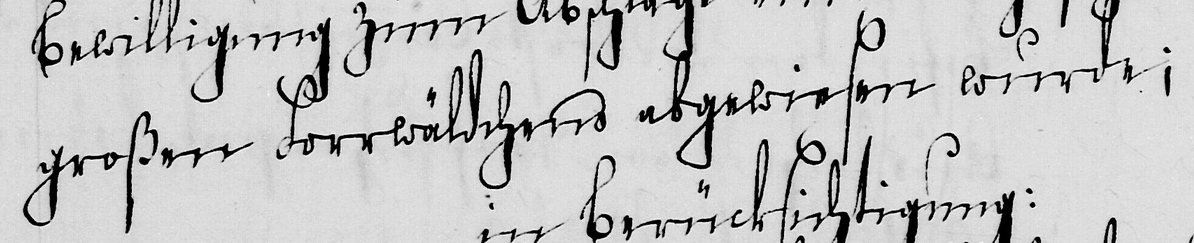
großen Forrwäldchens abgewiesen wurde;
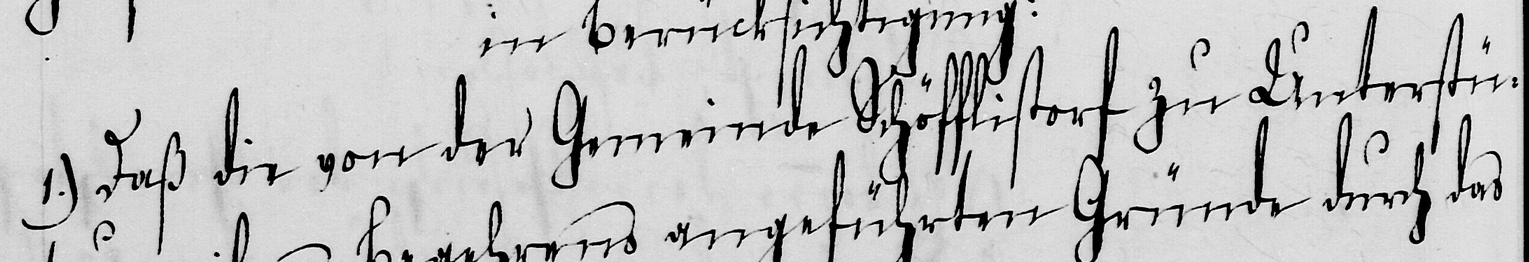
1.) Daß die von der Gemeinde Schöfflistorf zu Unterstü¬
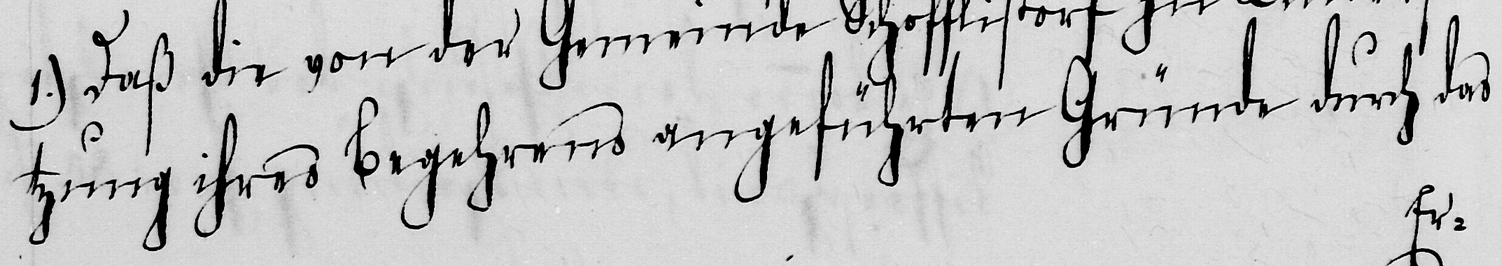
tzung ihres Begehrens angeführten Gründe durch das
